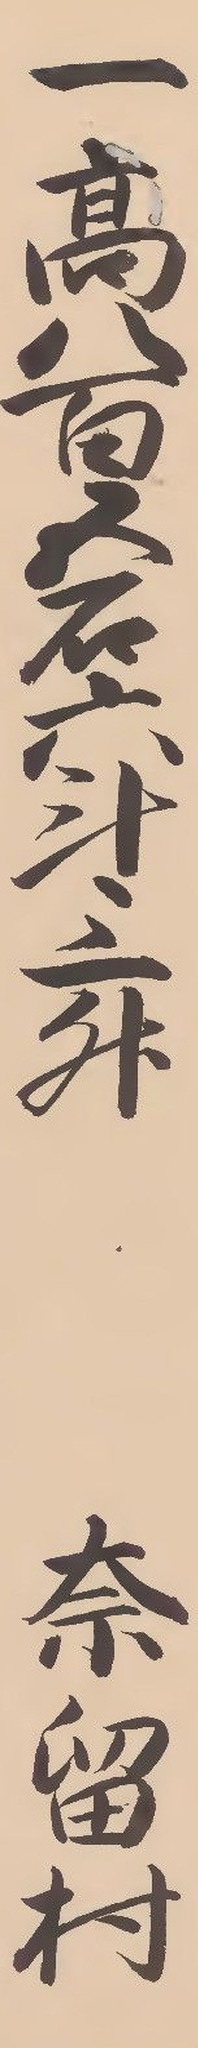一高八百五石六斗三升奈留村
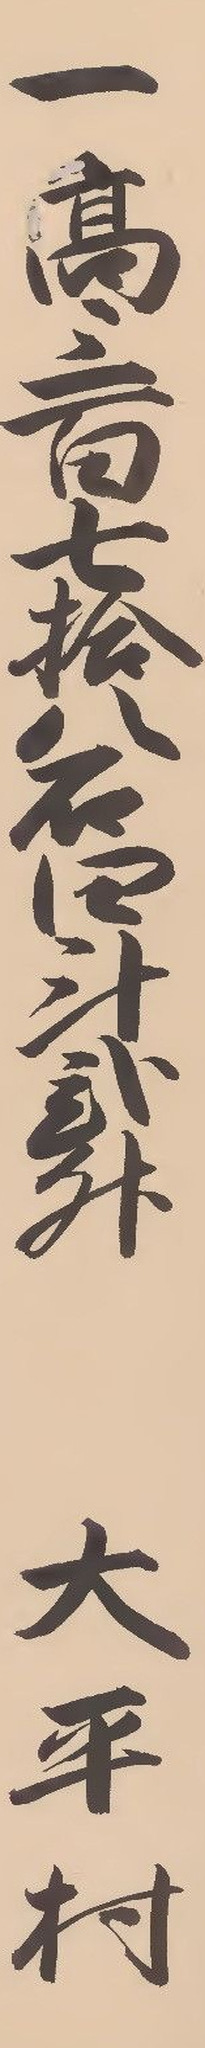一高三百七拾八石四斗弐升大平村
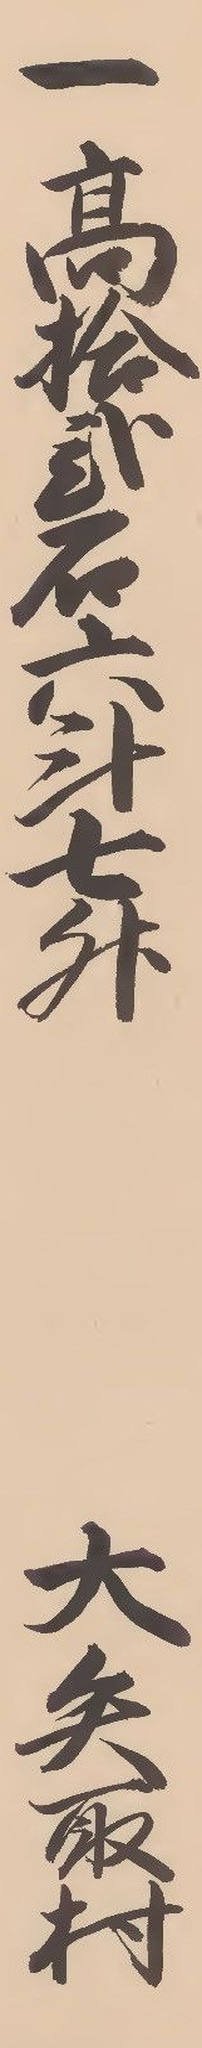一高拾弐石六斗七升大矢取村
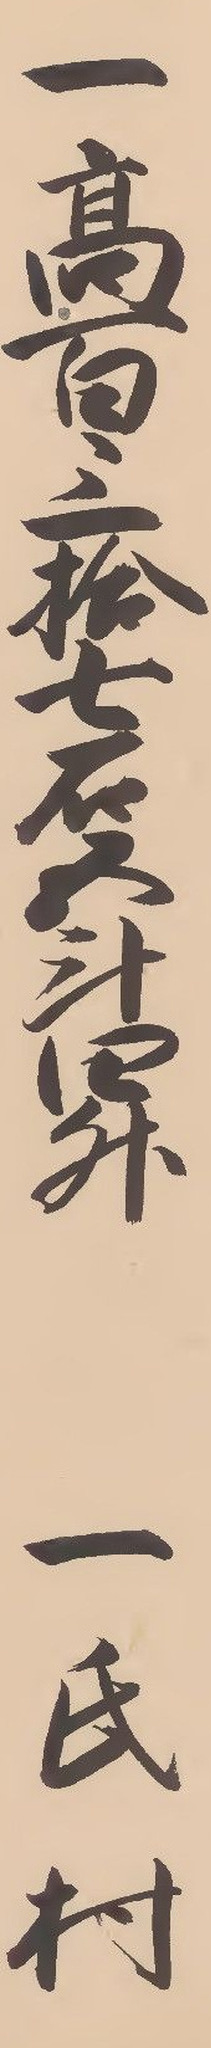一高百三拾七石五斗四升一氏村
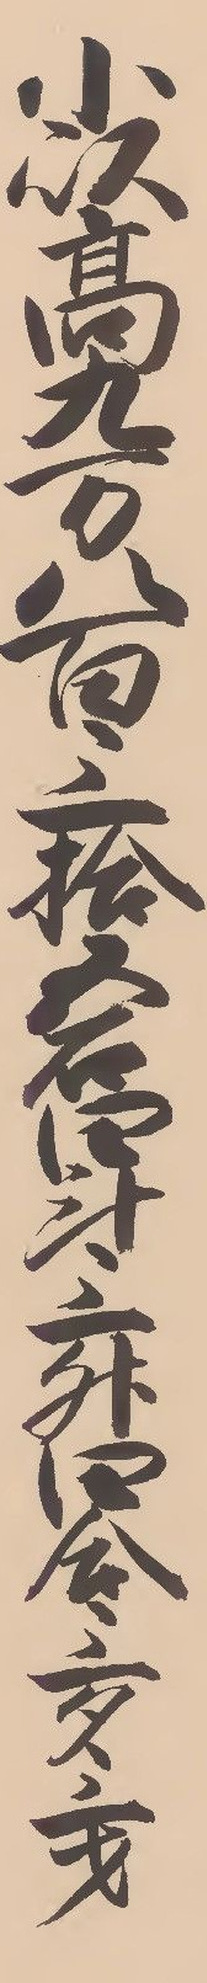小以高九万八百三拾五石四斗三升四合三勺三才

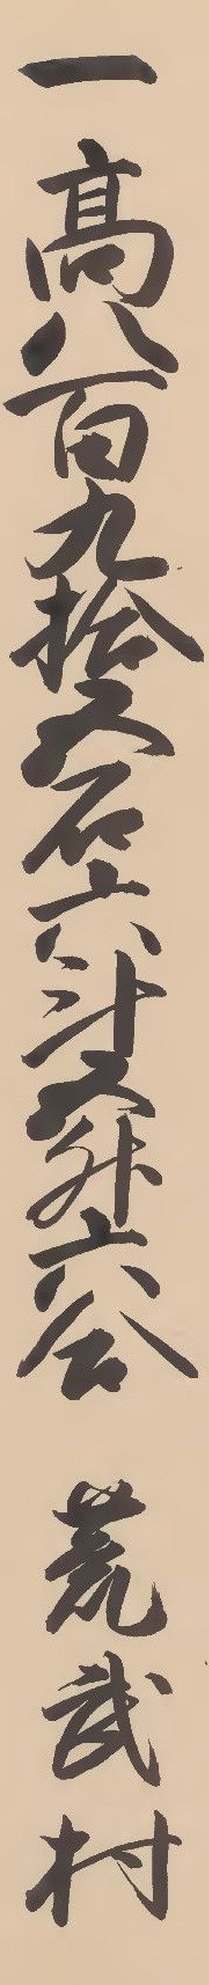一高八百九拾五石六斗五升六合荒武村
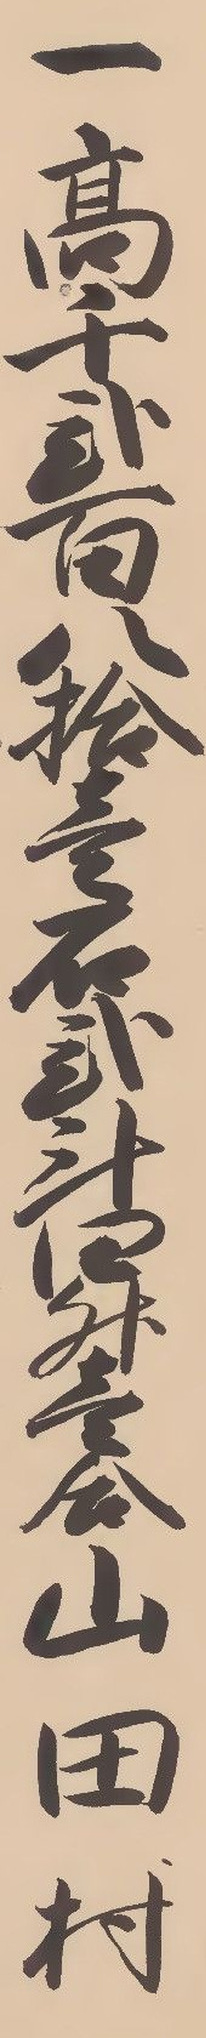一高千弐百八拾壱石弐斗四升壱合山田村
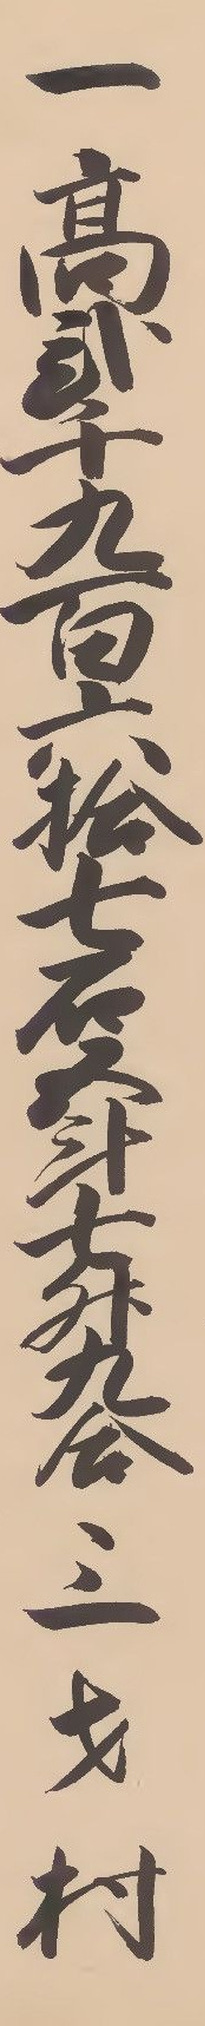一高弐千九百六拾七石五斗七升九合三才村

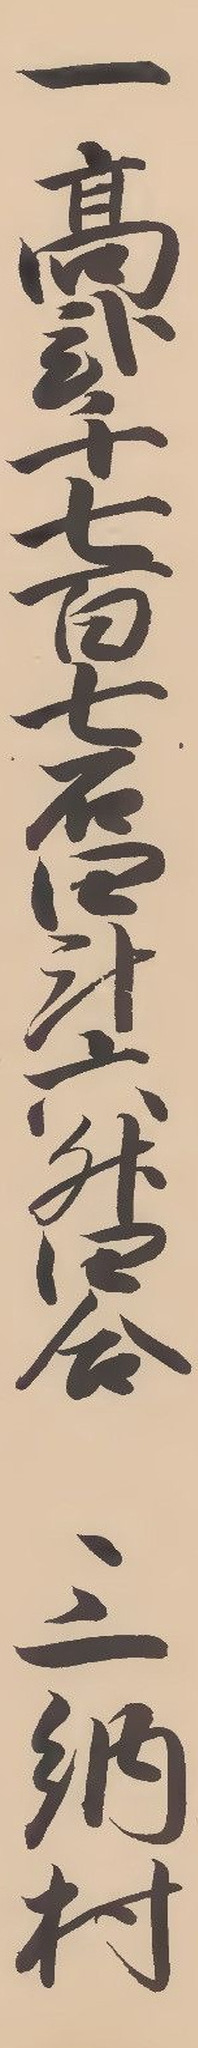一高弐千七百七石四斗六升四合三納村
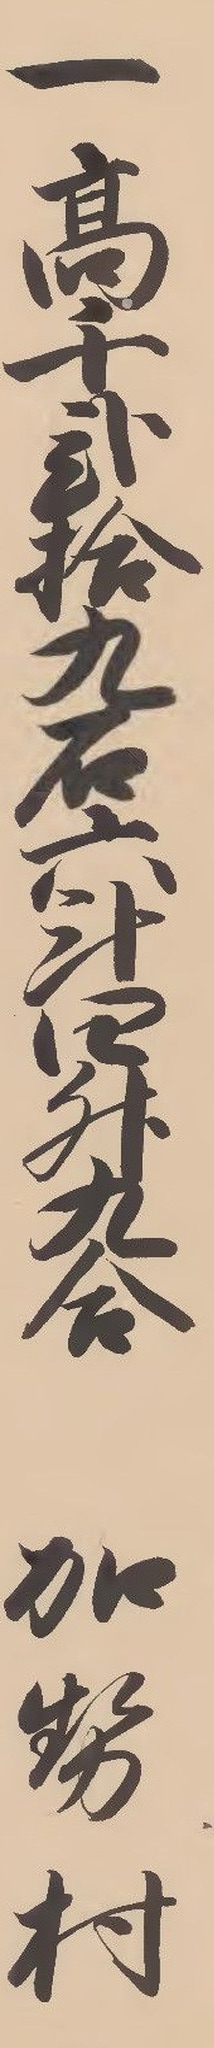一高千弐拾九石六斗四升九合加勢村
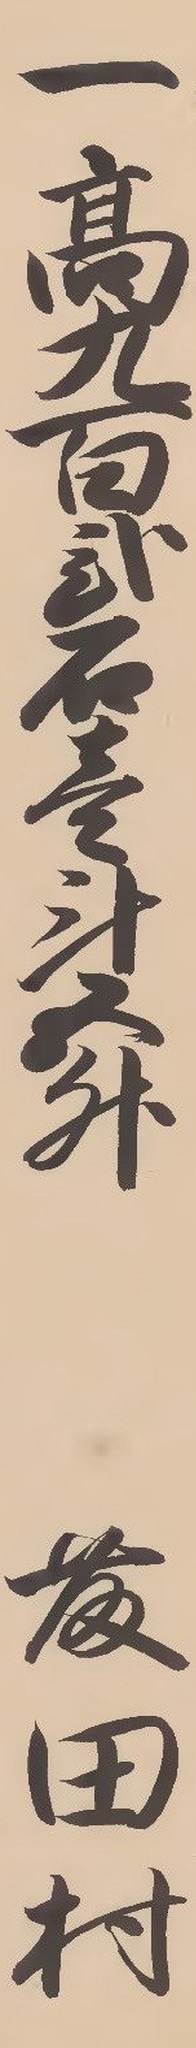一高九百弐石壱斗五升藤田村
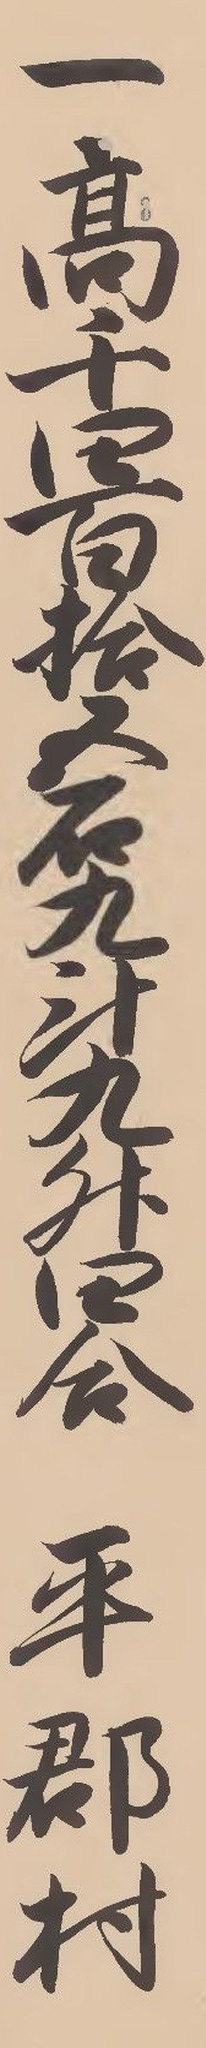一高千四百拾五石九斗九升四合平郡村
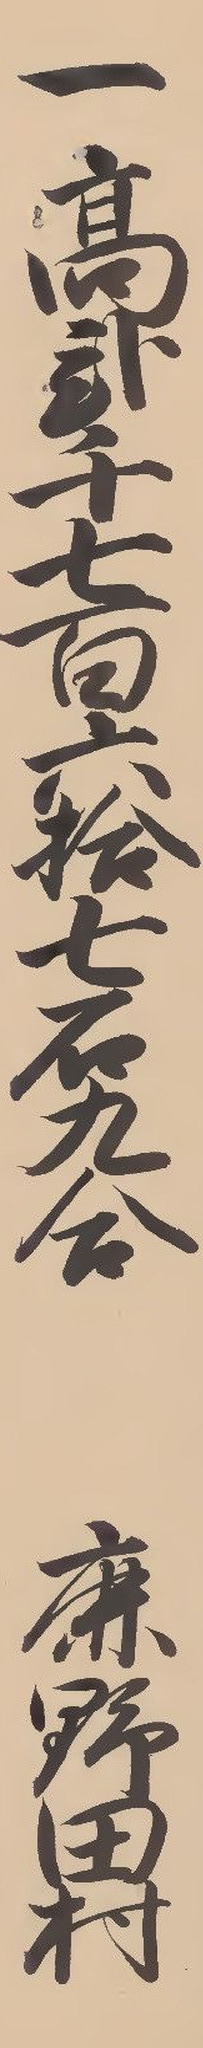一高弐千七百六拾七石九合鹿野田村
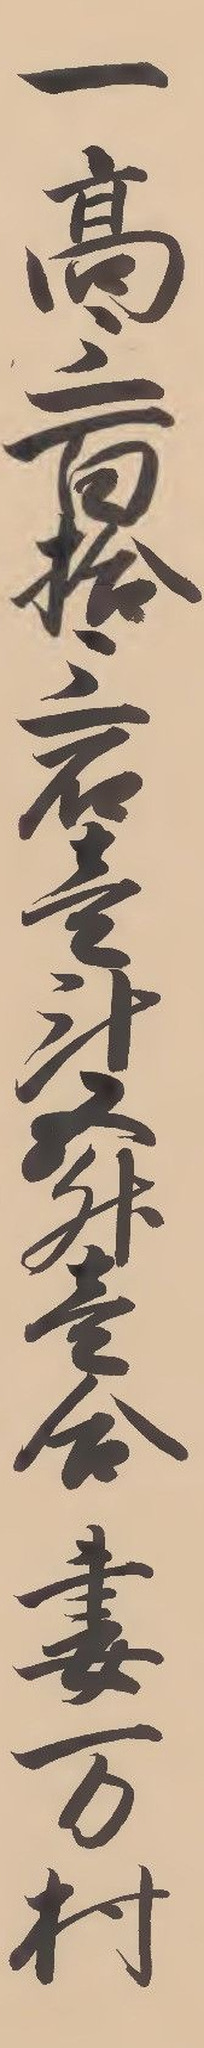一高三百拾三石壱斗五升壱合妻万村
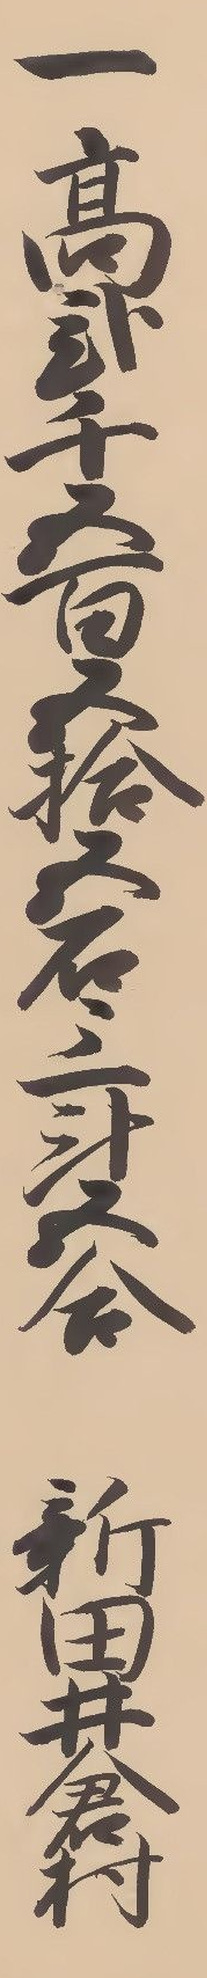一高弐千五百五拾五石三斗五合新田井倉村
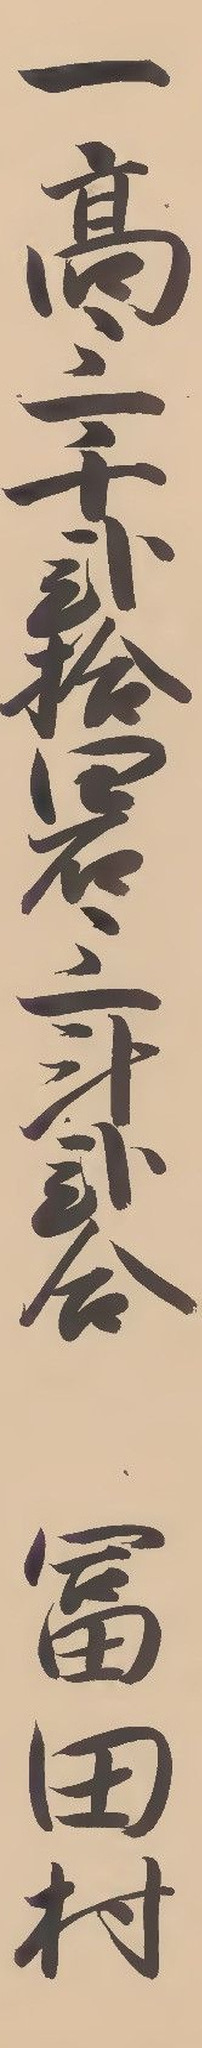一高三千弐拾四石三斗弐合富田村
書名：日向国郷帳
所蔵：国立公文書館 National Archives of Japan
